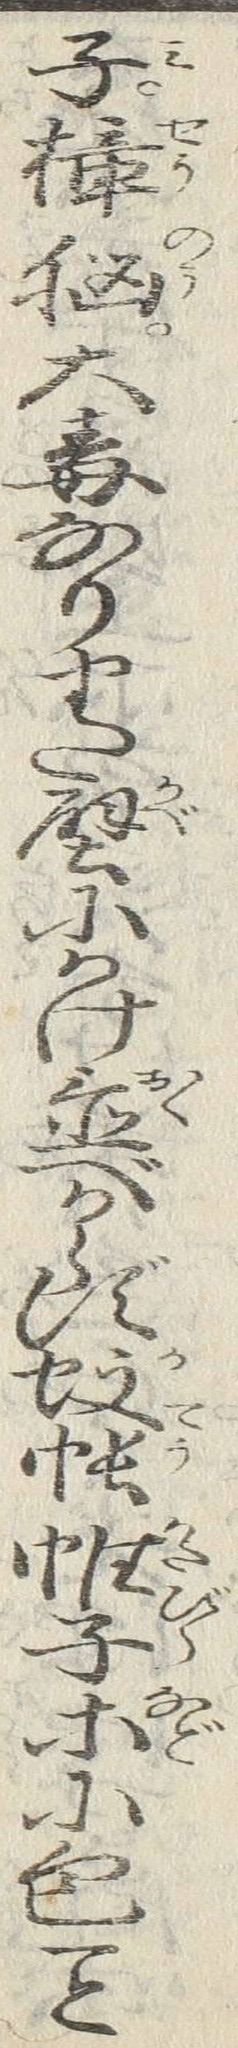子。樟脳。大毒なりまた壁にかけ置べからず蚊帳帷子等に包こと
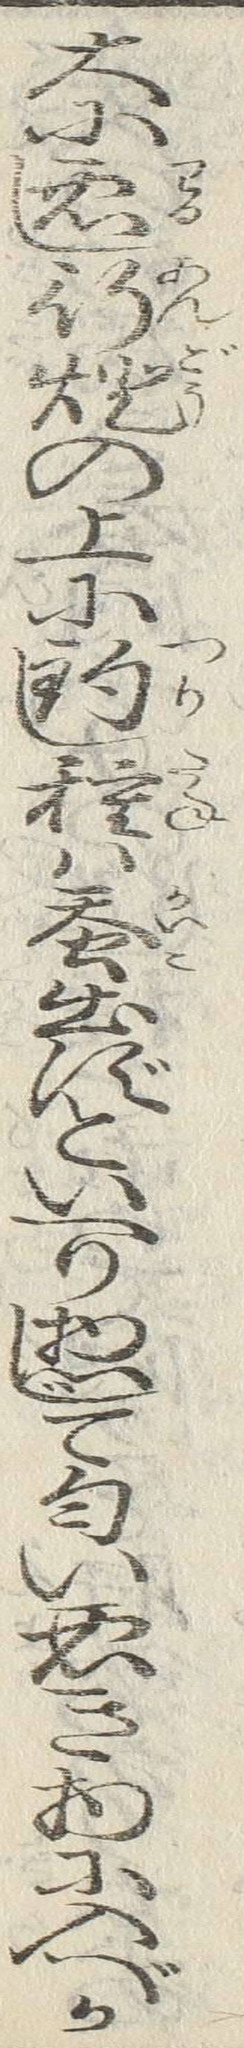大に悪し行燈の上に釣し種は蚕出ずといへり惣じて匀い悪き物に入べか
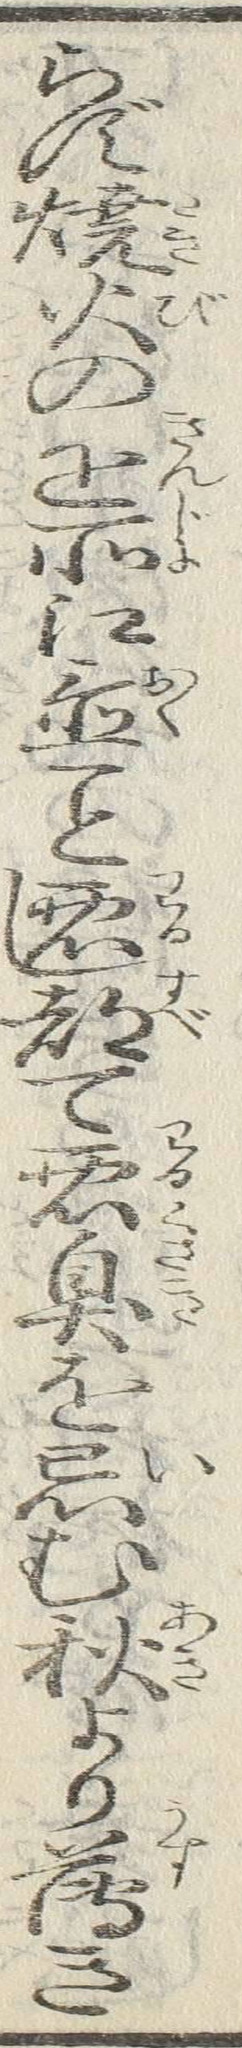らず燒火の近所え置こと悪し都て悪臭を忌む秋より薄き
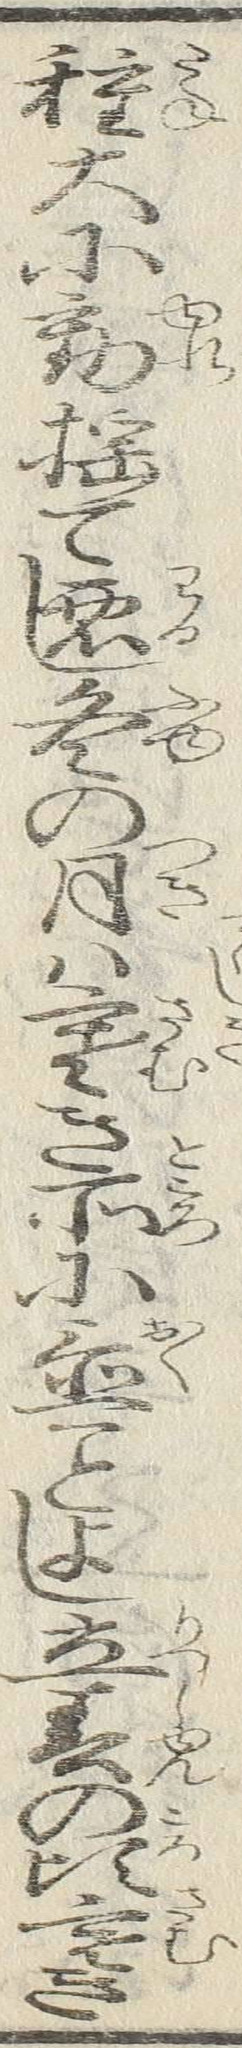種大に動揺て悪し冬の月は寒き所に置ことよし立春の頃寒き
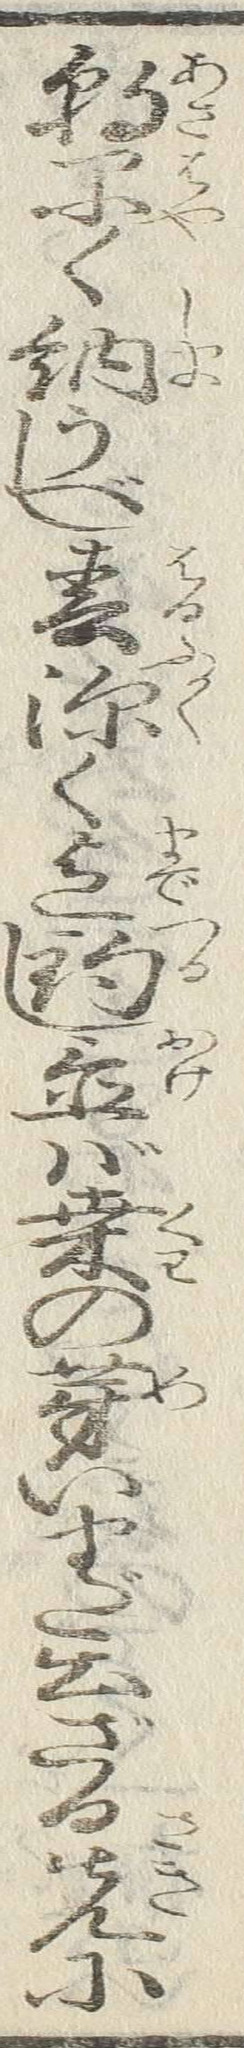朝早く納うべし春深く迄釣し置ば桒の芽いまだ出ざる先に
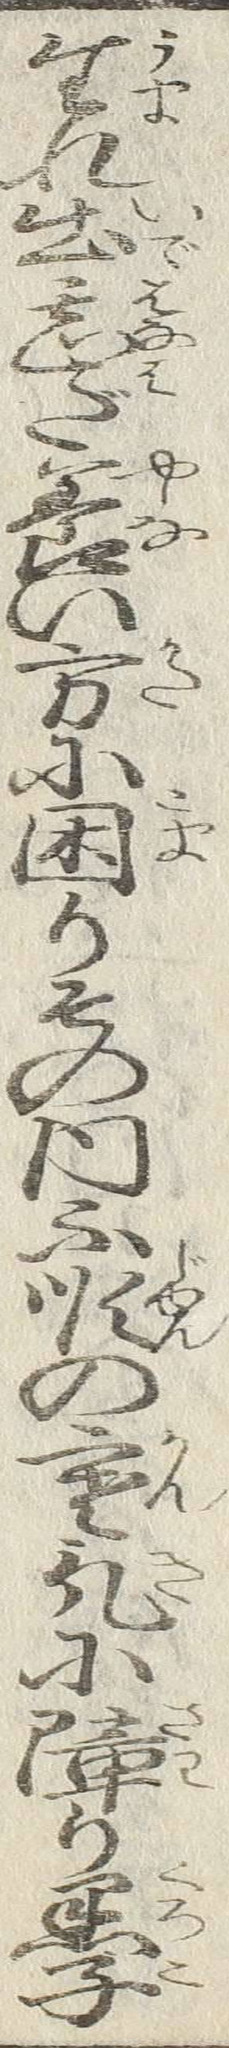生れ出甚だ養い方に困りその内ふ順の寒気に障り黒子
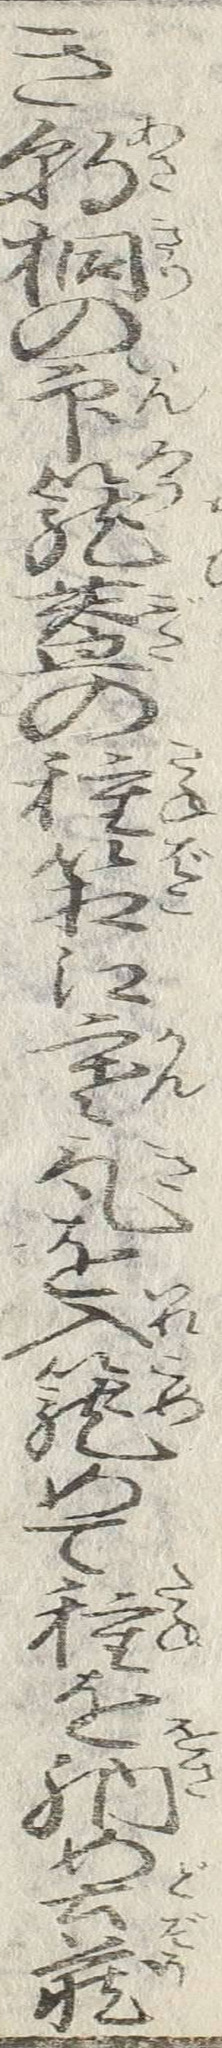き朝桐の印籠蓋の種箱え寒気を入籠めて種を納め土藏蔵
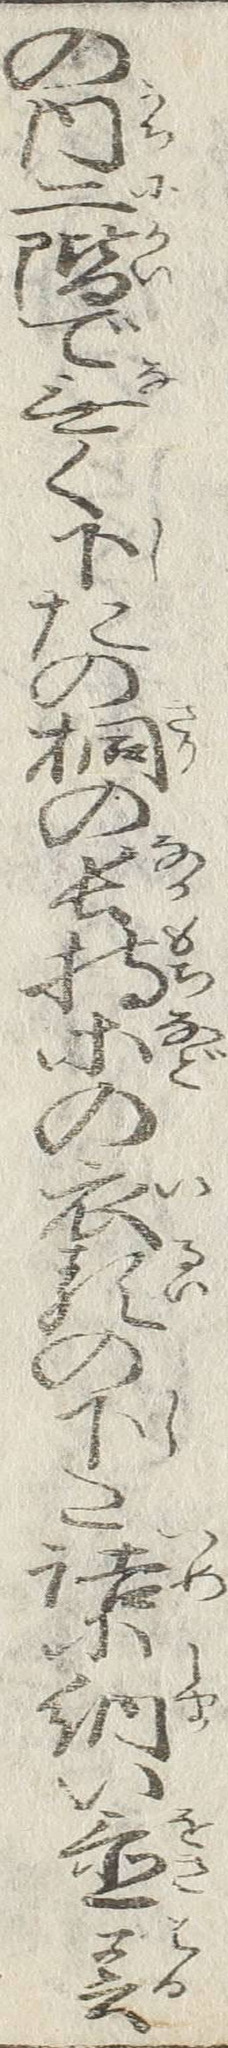の内二階で無く下たの桐の長持等の衣類の下た詰に納い置春
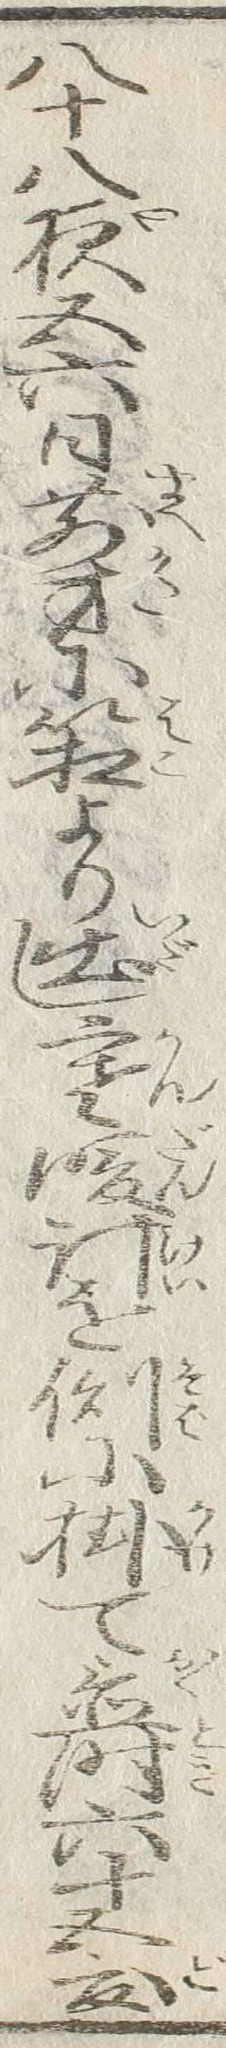八十八夜五六日前方に箱より出し寒暖計を側に掛て置時六十五度
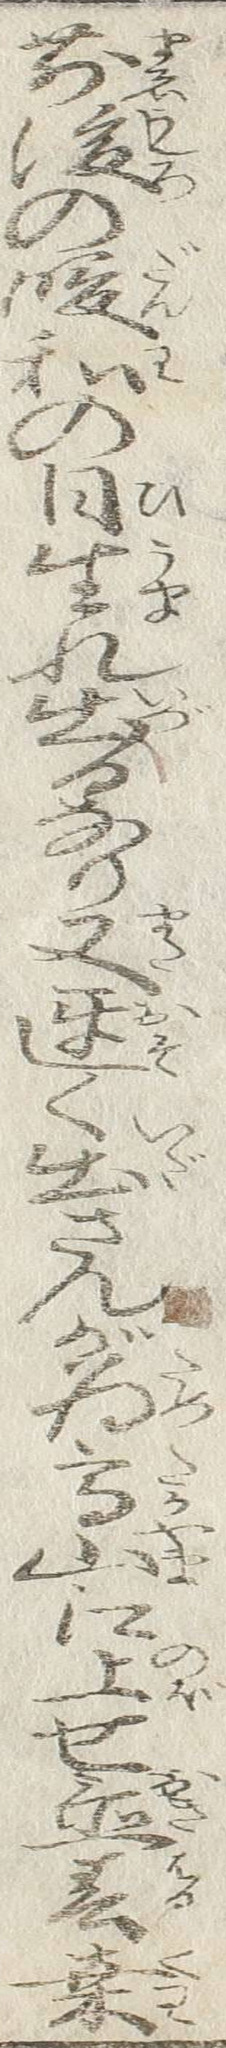前後の暖和の日生れ出るなり又遅く出さんが為高山え上せ置春桒
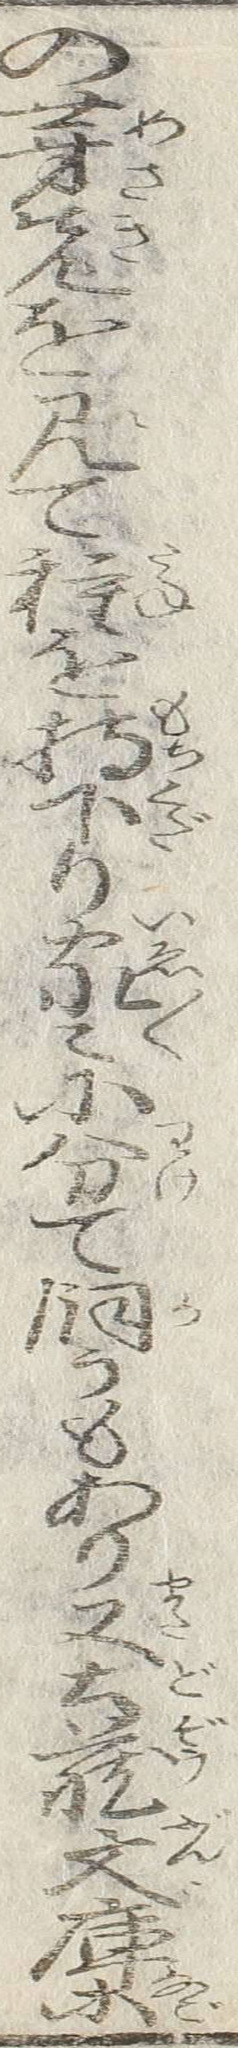の芽先を見て種を持下り家々に分て飼うもあり又土藏文庫等
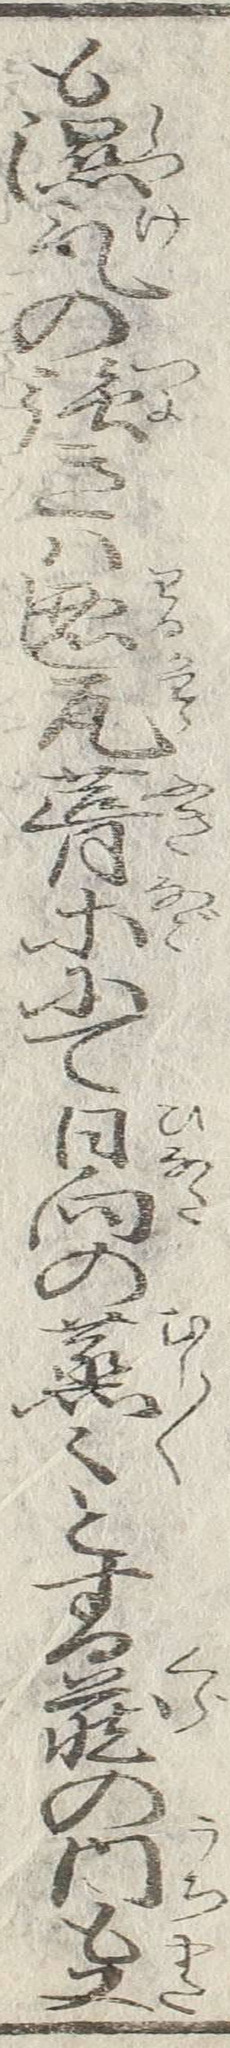も濕気の強きは悪し瓦葺等にて日向の蒸々とする藏の内も又
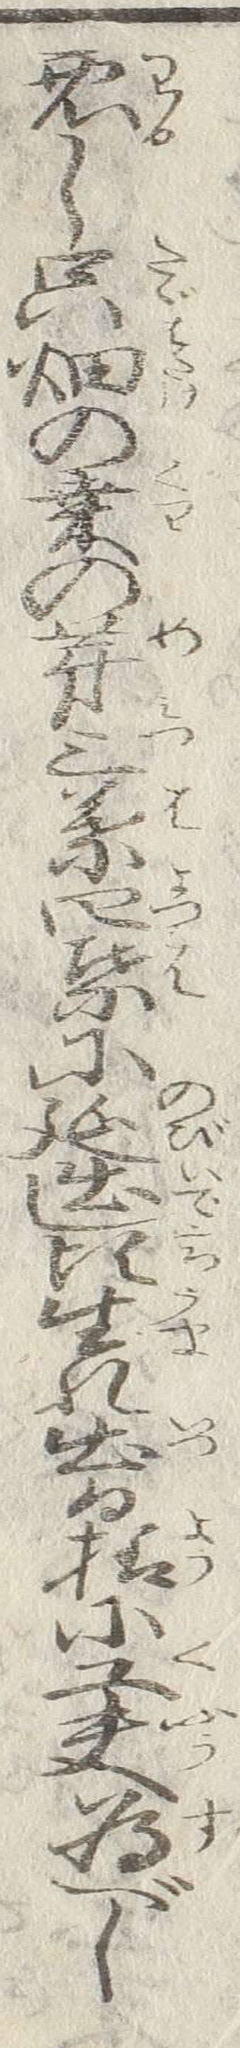悪し只畑の桒の芽三葉四葉に延出し頃生れ出る様に工夫為べし
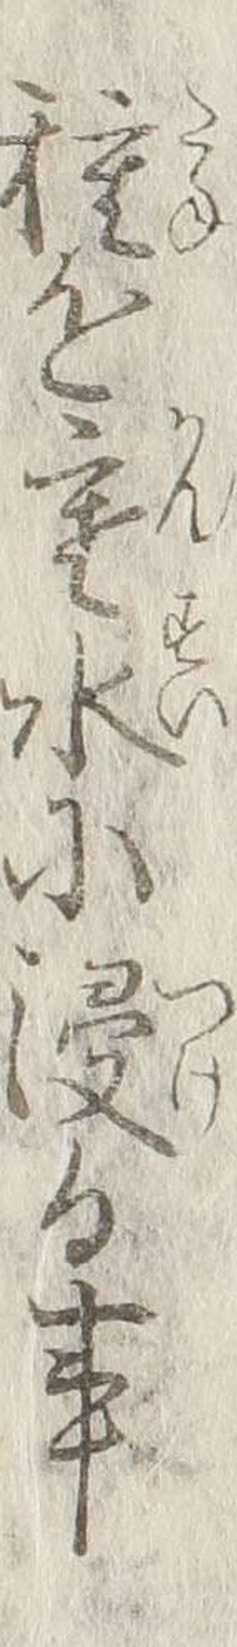種を寒水に浸る事
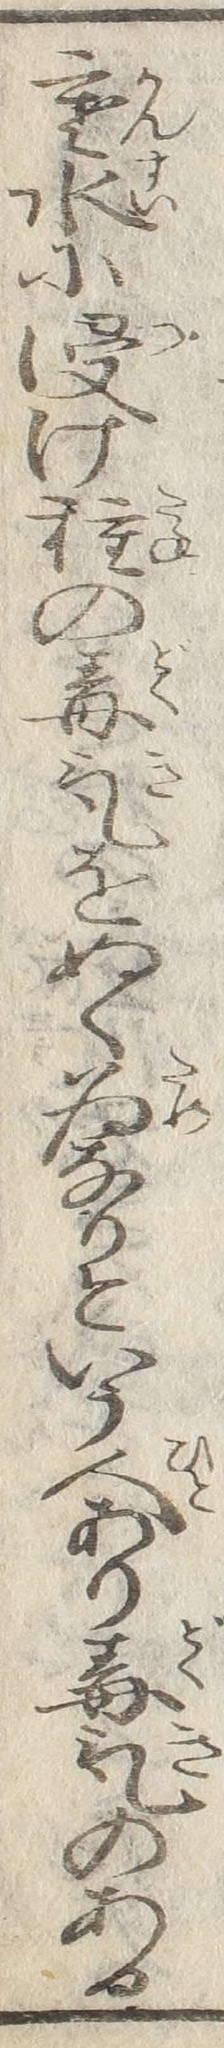寒水に浸け種の毒気をぬく為なりという人あり毒気のある

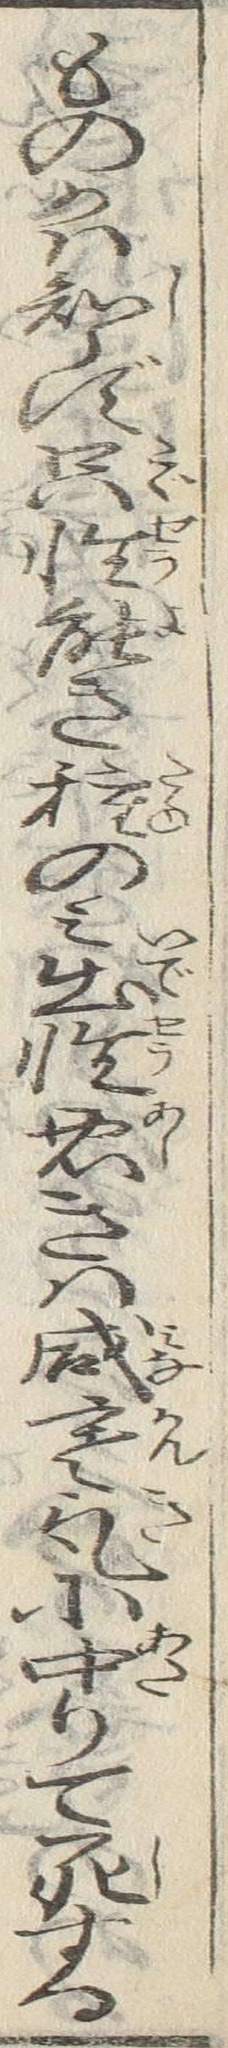ものかは知らず只性能き種のみ出性悪きは咸寒気に中りて死する
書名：養蠶實驗録
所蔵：東京大学農学生命科学図書館 国文学研究資料館
